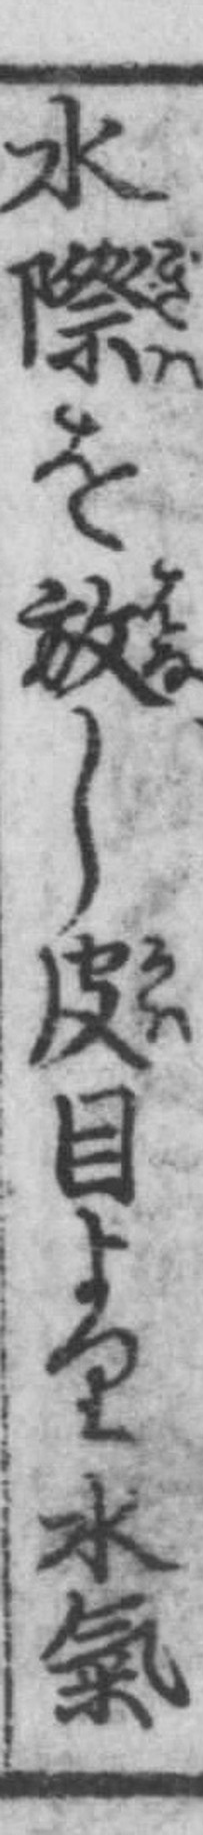水際を放し皮目より水氣
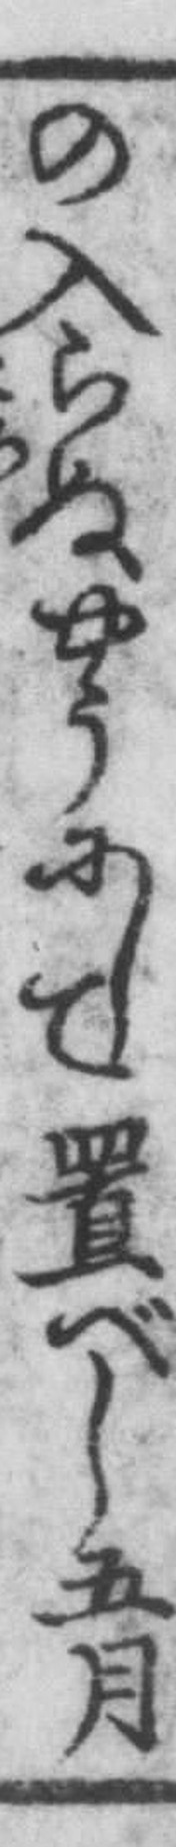の入らぬやうにて置くべし五月
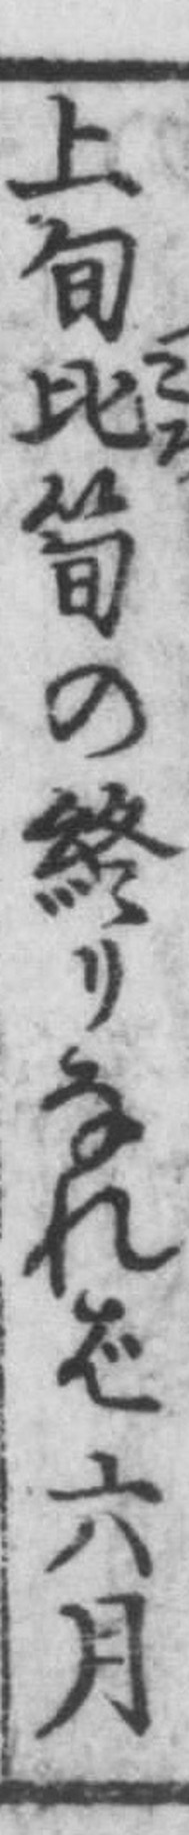上旬比筍の終リなれば六月
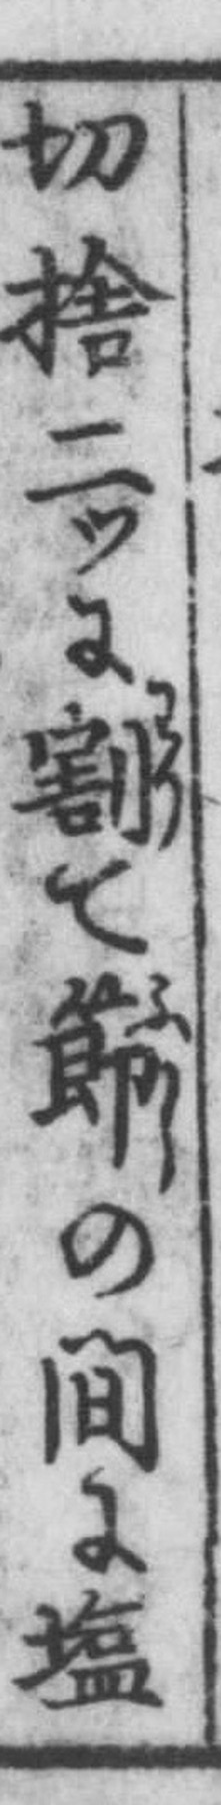切捨て二ツに割て節の間に塩
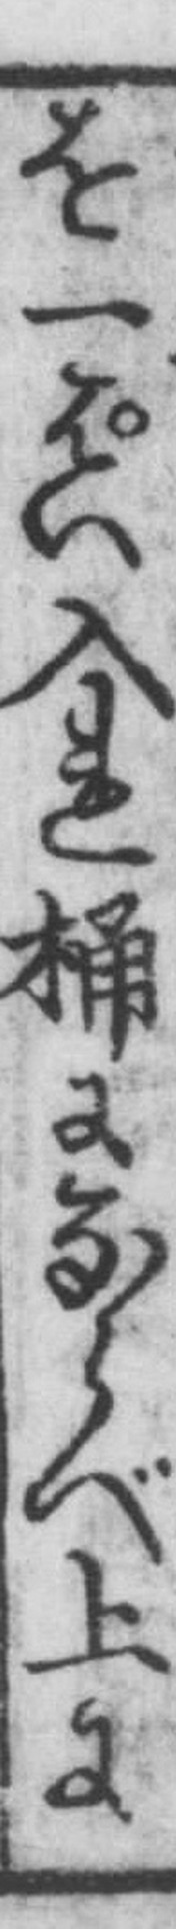を一ぱい入れ桶にてならべ上に
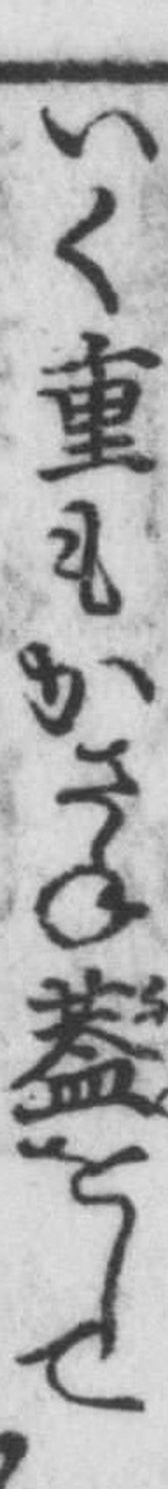いく重もかさね蓋をして
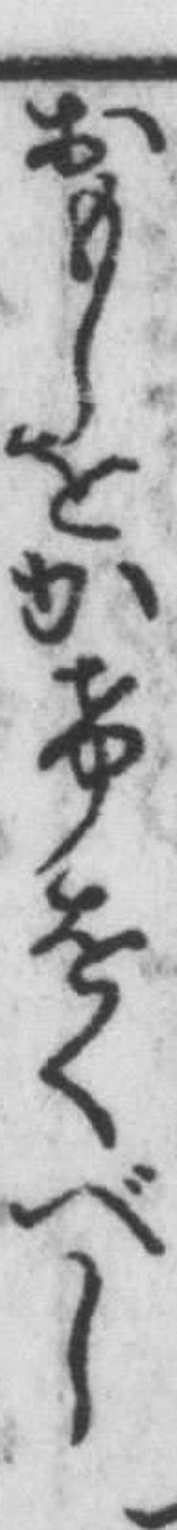おもしをかけをくべし
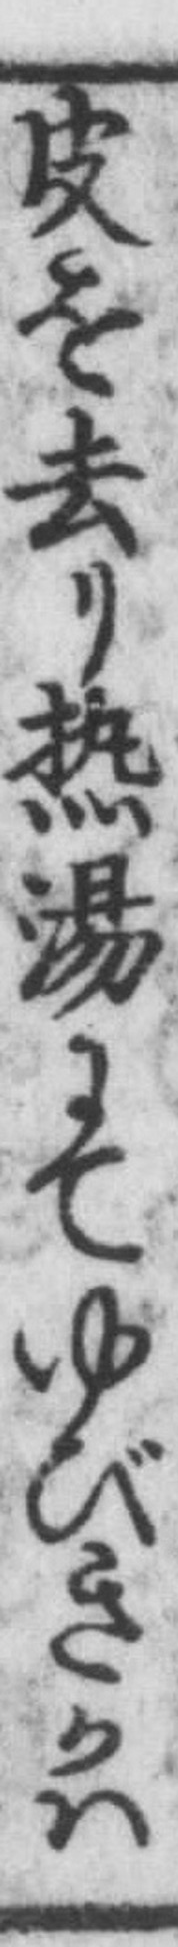皮を去り熱湯にてゆびきかハ
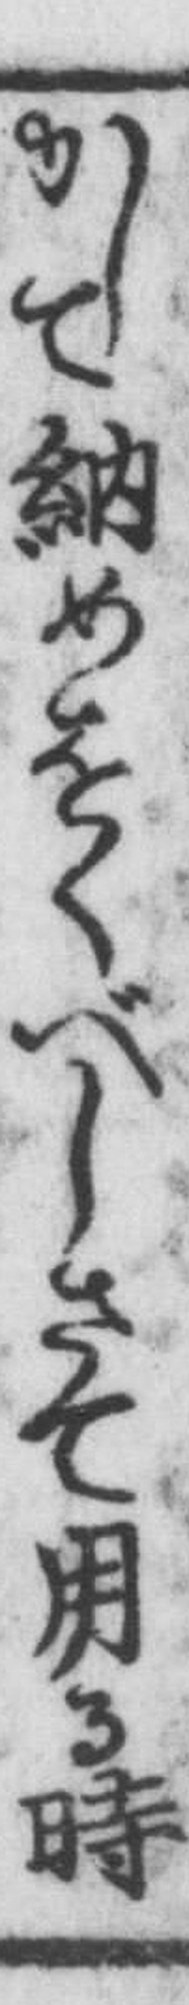引て納めをくべしさて用る時
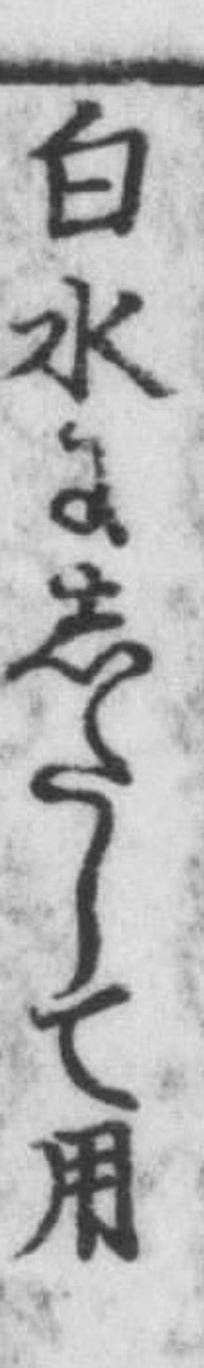白水いんしたして用
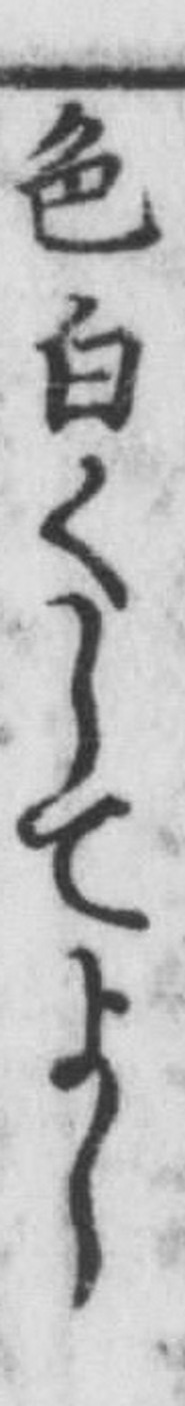白白くしてよし
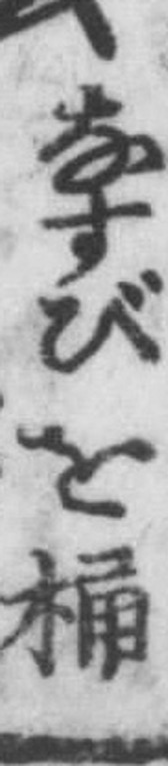なすびを桶
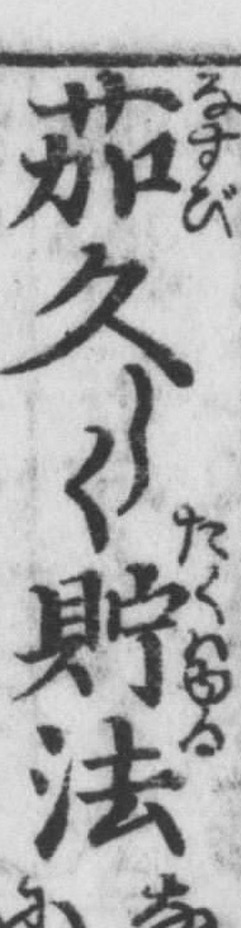茄子久しく貯法
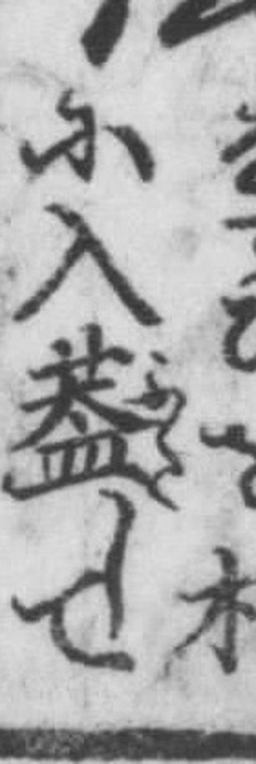に入蓋して
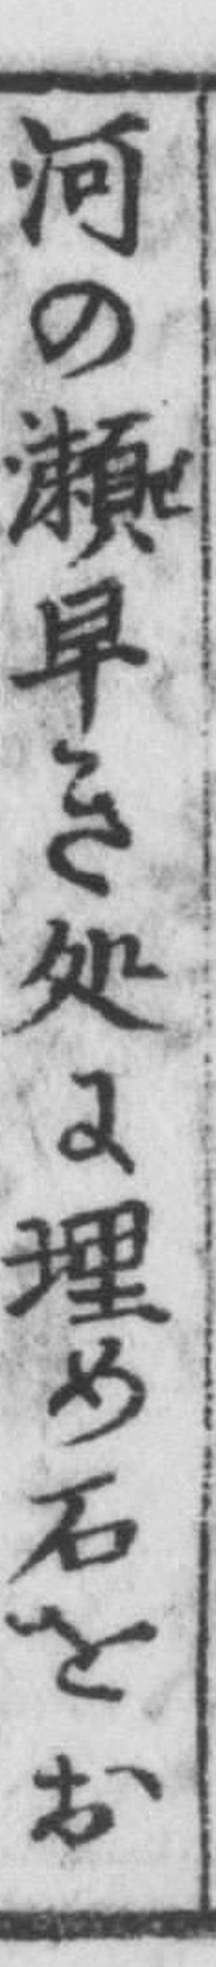河の瀬早き処に埋め石を
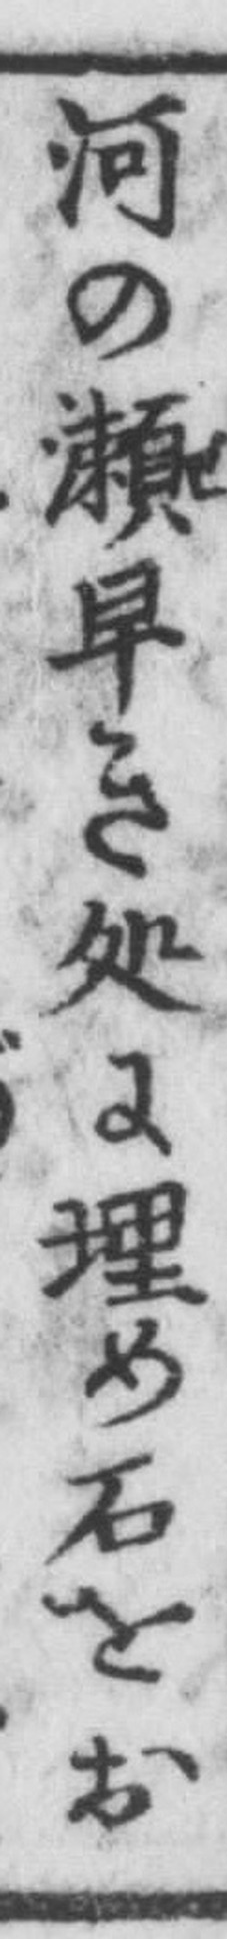河の瀬早き処に埋め石を
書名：当世料理筌
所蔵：大阪府立大学学術情報センター 国文学研究資料館
